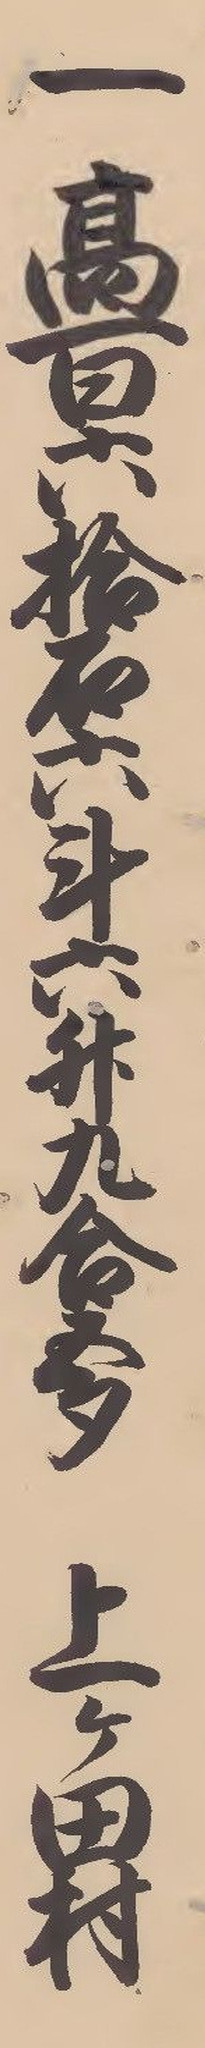一高百六拾石六斗六升九合五勺上ヶ田村
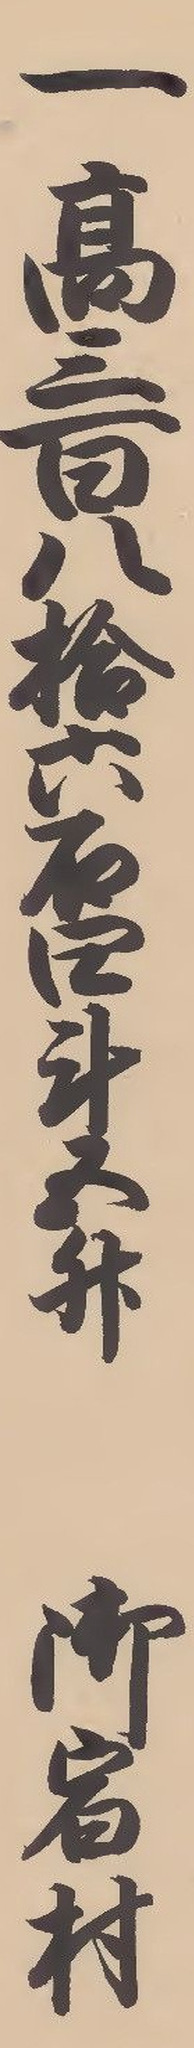一高三百八拾六石四斗五升御宿村
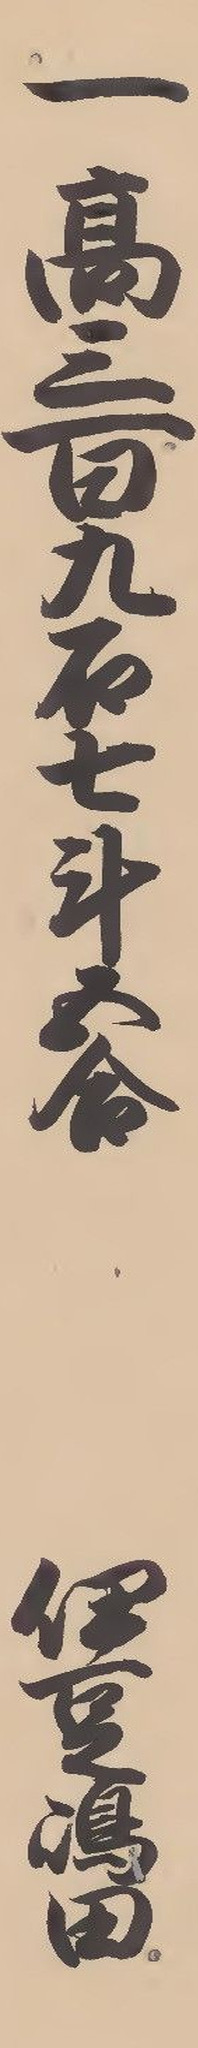一高三百九石七斗五合伊豆島田
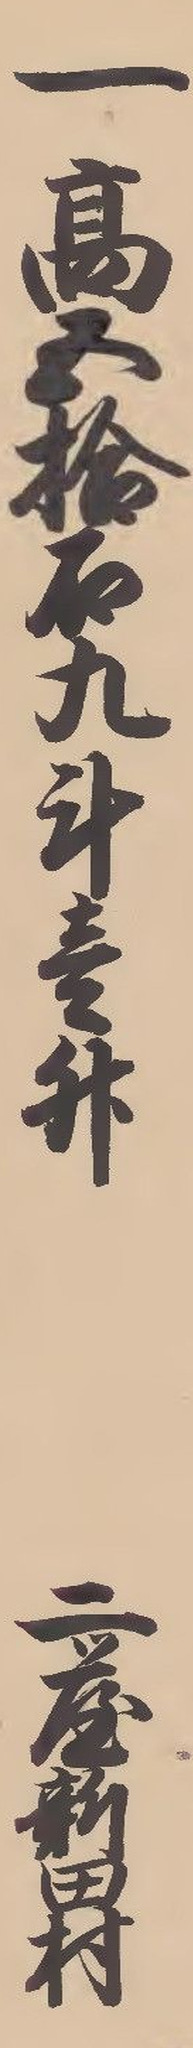一高五拾石九斗壱升二ツ屋新田村
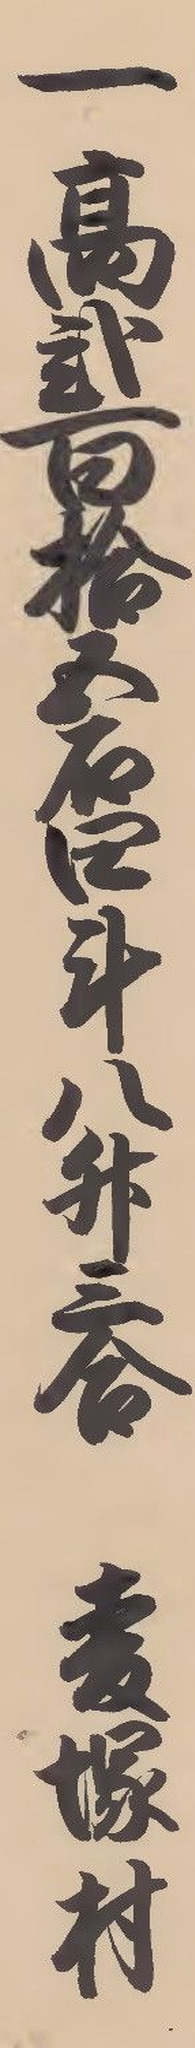一高弐百拾五石四斗八升三合麦塚村
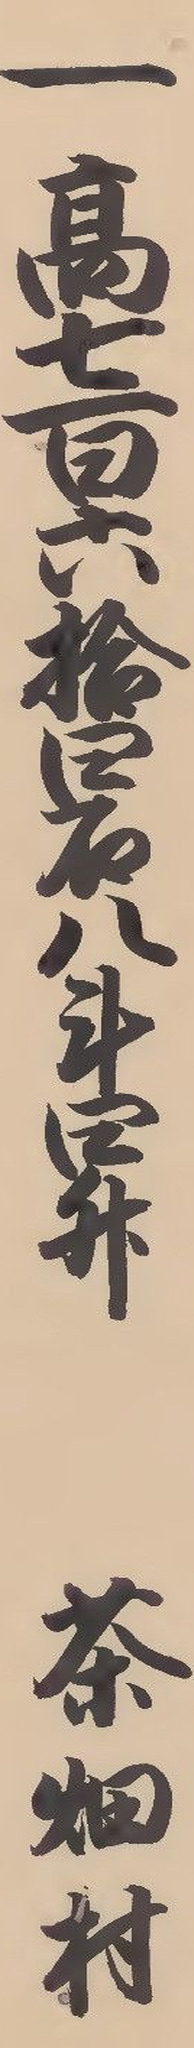一高七百六拾四石八斗四升茶畑村
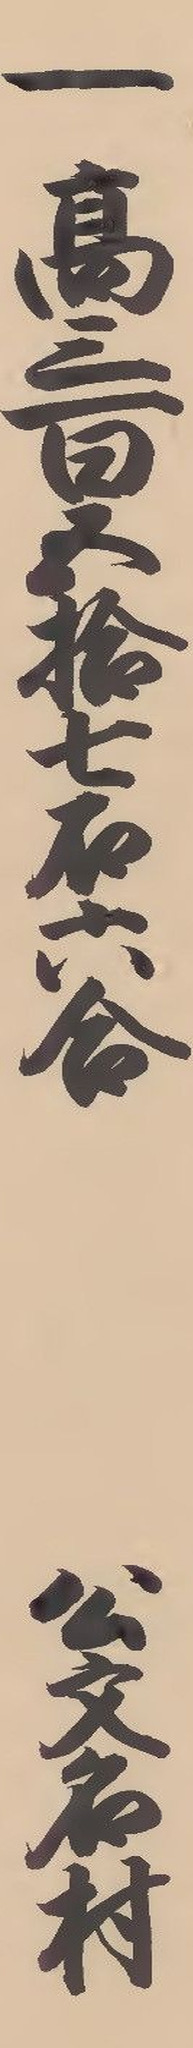一高三百五拾七石六合公文名村
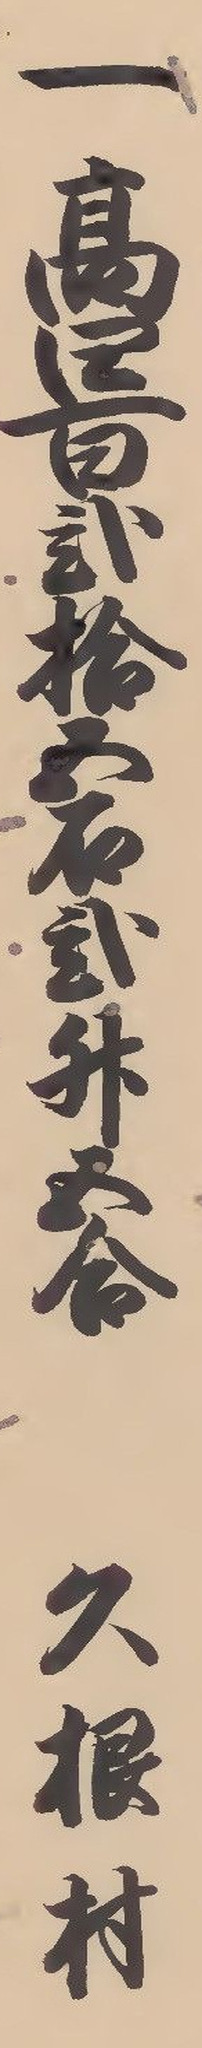一高四百弐拾五石弐升五合久根村

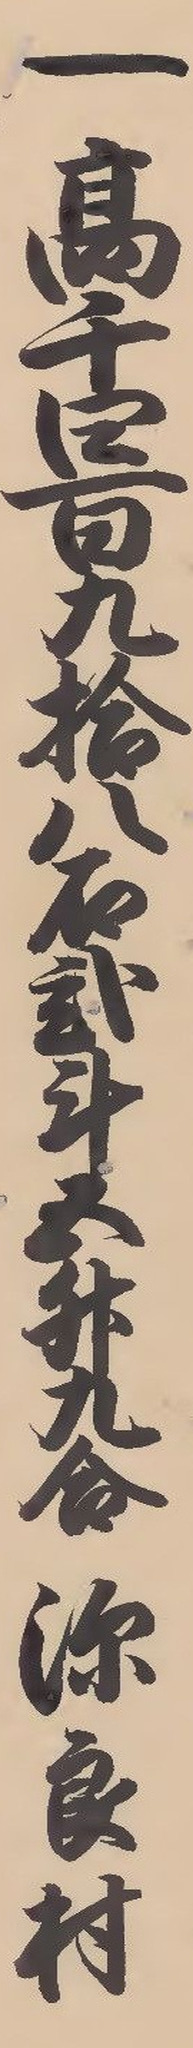一高千四百九拾八石弐斗五升九合深良村
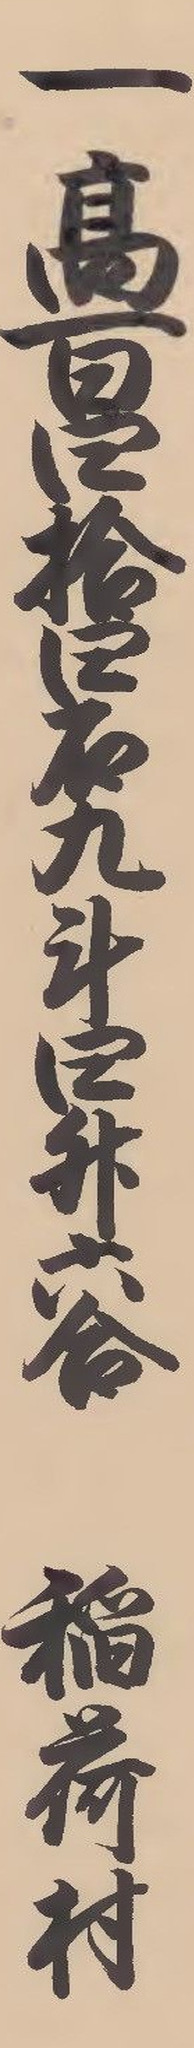一高百四拾四石九斗四升六合稲荷村
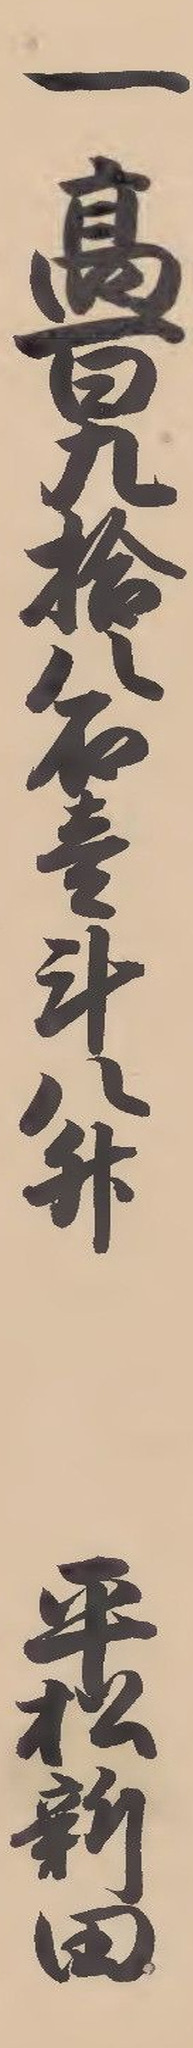一高百九拾八石壱斗八升平松新田
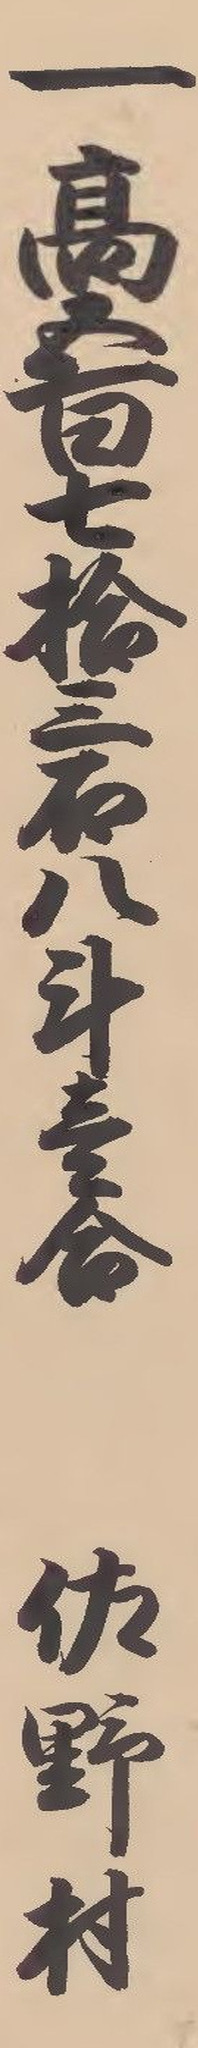一高五百七拾三石八斗壱合佐野村
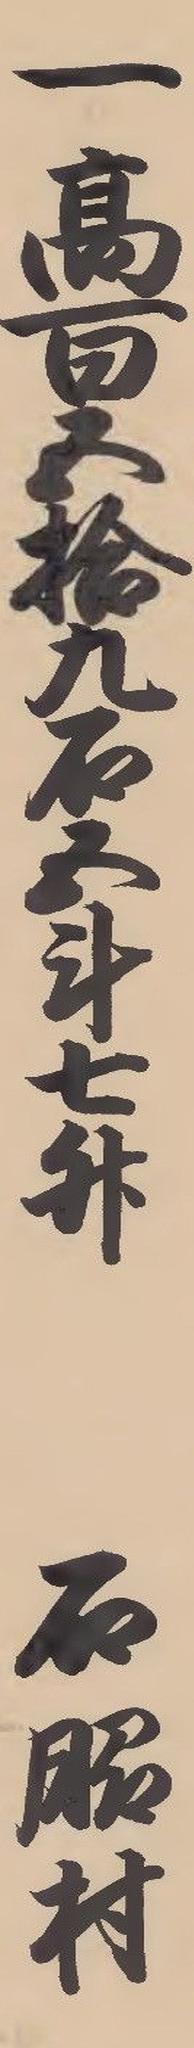一高百五拾九石五斗七升石脇村
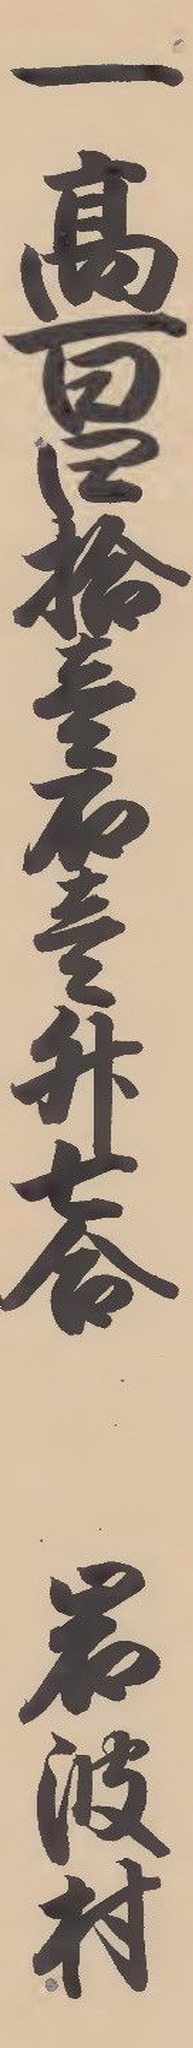一高百四拾壱石壱升七合岩波村
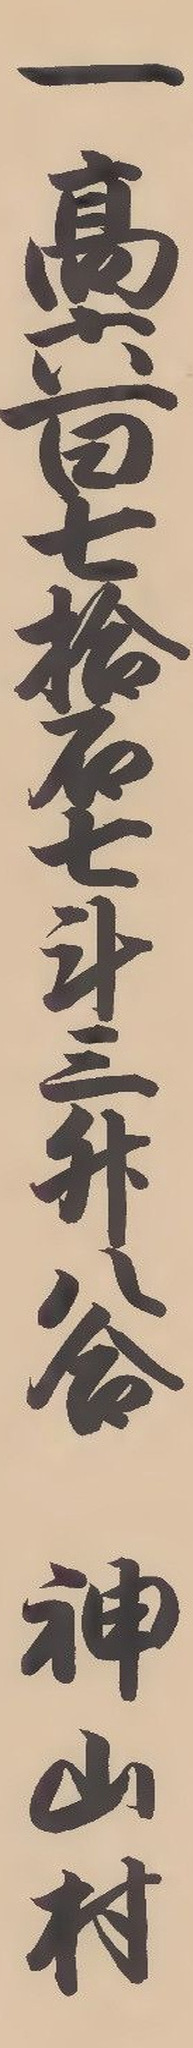一高六百七拾石七斗三升八合神山村

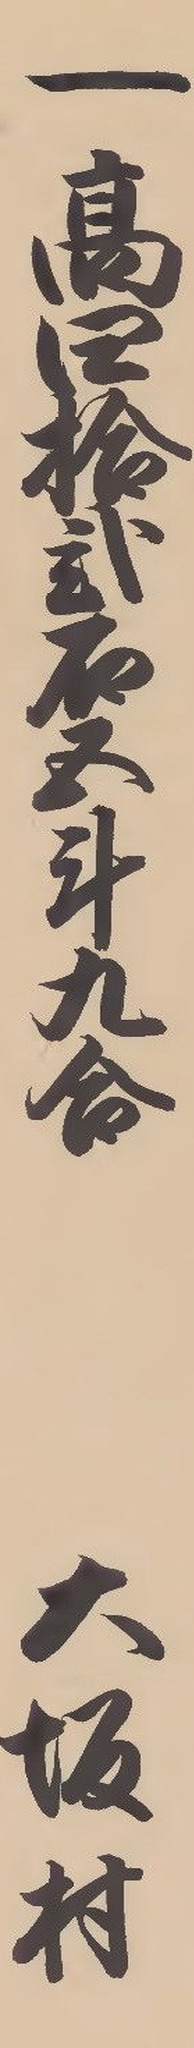一高四拾弐石五斗九合大坂村
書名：駿河国郷帳
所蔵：国立公文書館 National Archives of Japan
